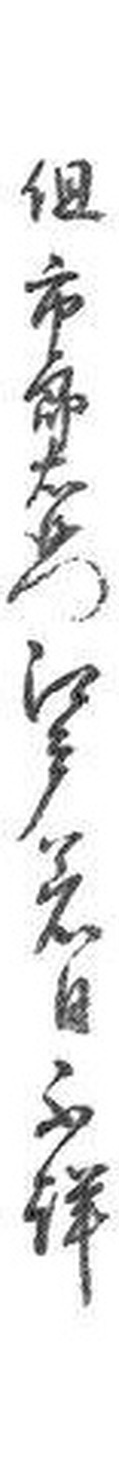但市郎右衛門江戸着日不詳
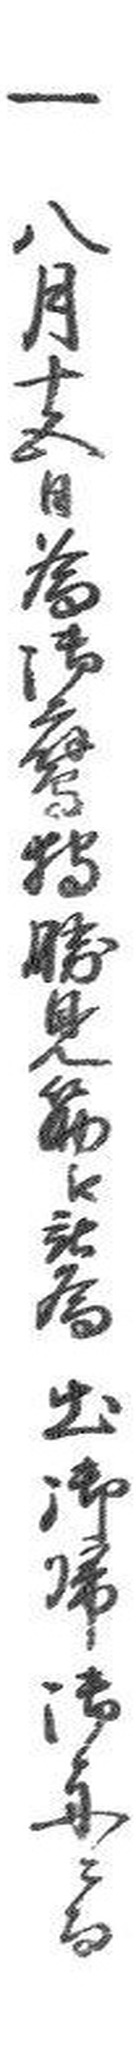一八月十五日為御鷹狩勝見筋江被為出御帰御船ニ而
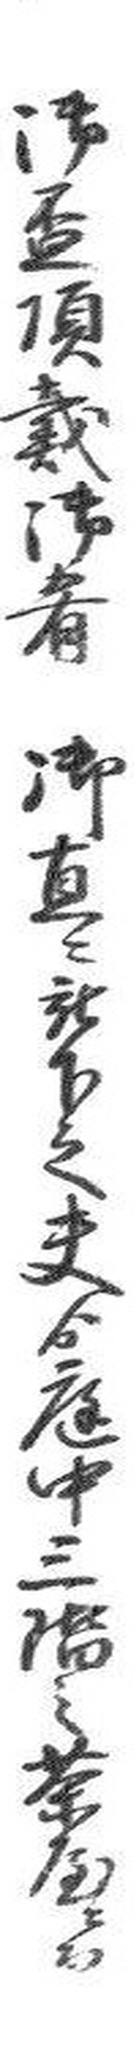御盃頂戴御肴御直ニ被下之夫ゟ庭中三階之茶屋ニ而
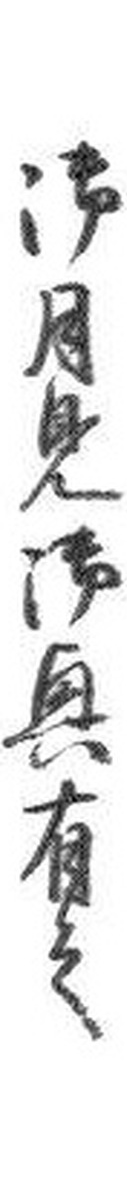御目見御興有之
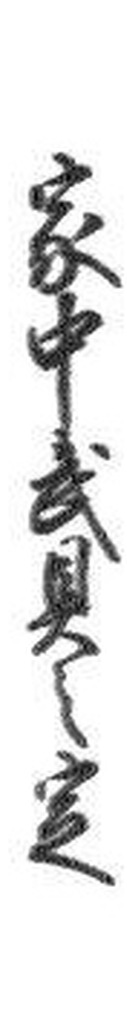家中武具之定
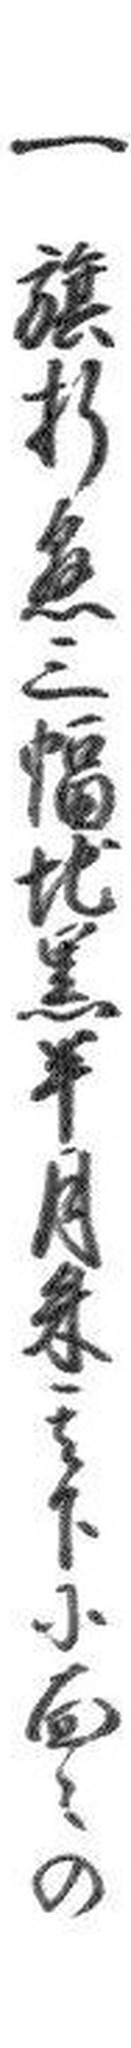一旗折懸三幅地黒半月朱其下に面々之
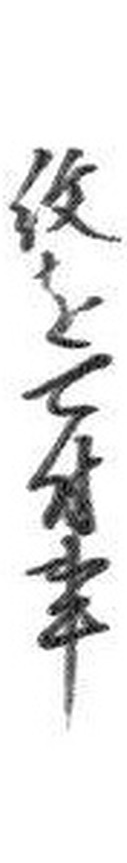紋を可付事
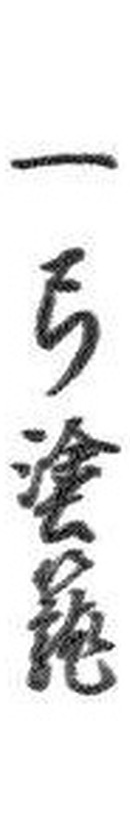一弓塗籠
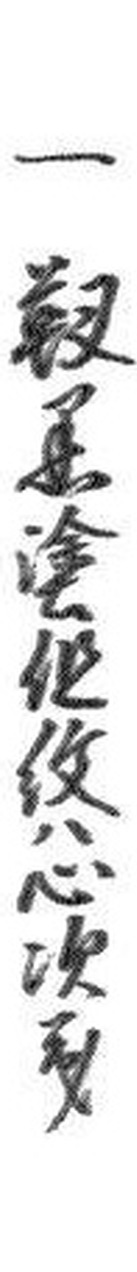一靱黒塗組紋ハ心次第
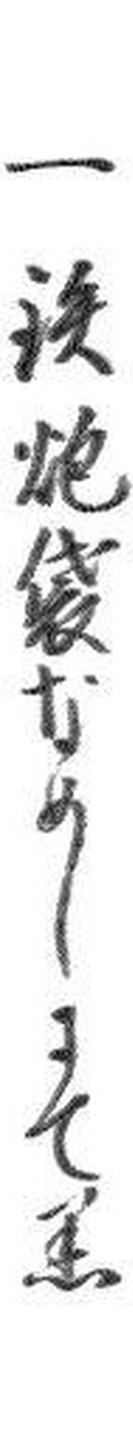一鉄砲袋なめしにて黒
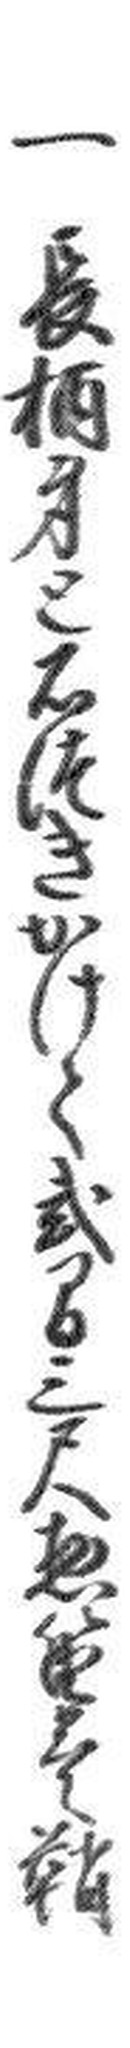一長柄身と石つきかけて弐間三尺惣篭巻鞘

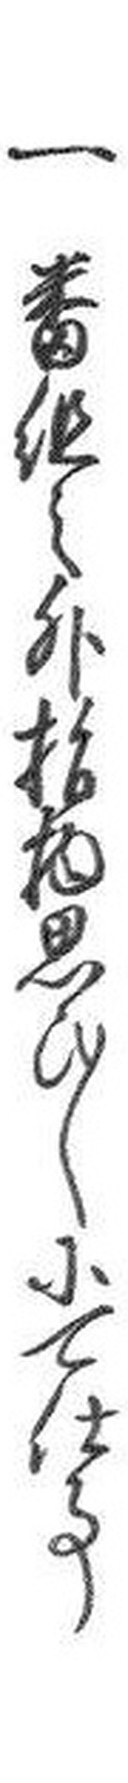一番組之外指物思ひ〳〵に可仕事
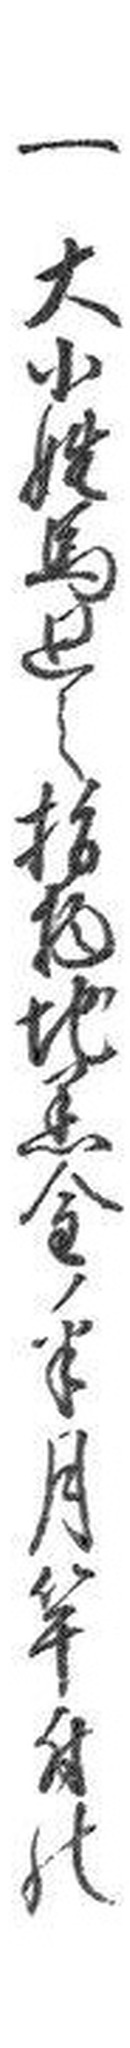一大小姓馬廻之指物地黒金ノ半月竿付の
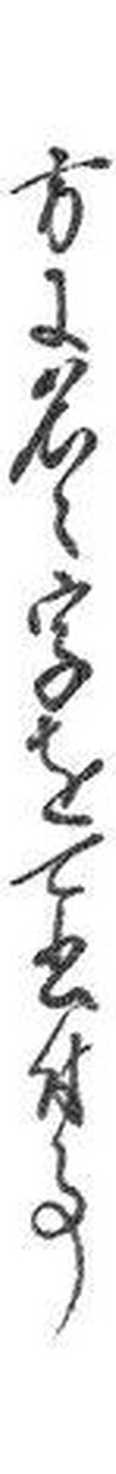方に名々字を可書付事
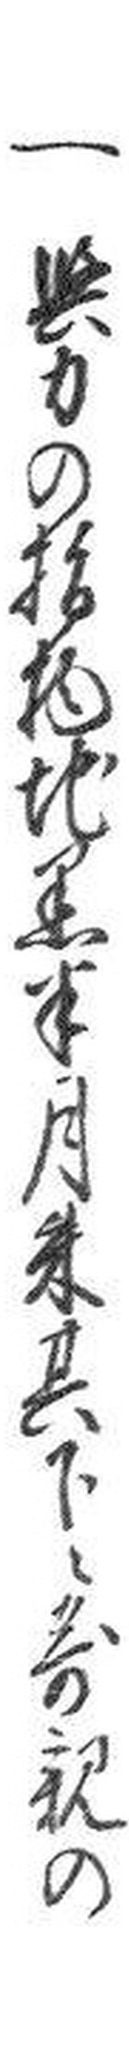一与力の指物地黒半月朱其下ニ寄親の
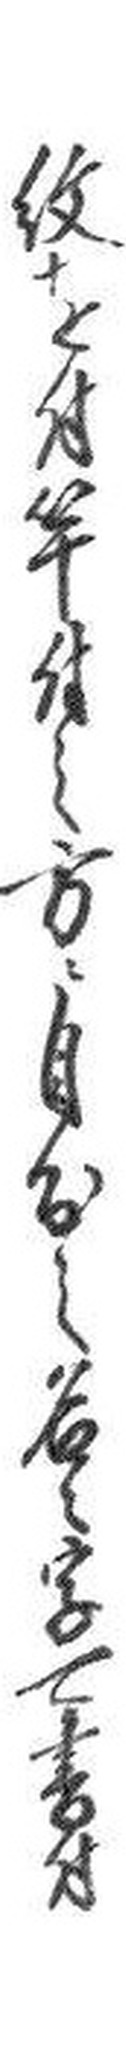紋を付竿付の方ニ自分の名々字可書付
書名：家譜 十一 昌親公 従延宝二年到延宝四年八月
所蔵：福井県文書館 Fukui Prefectural Archives
